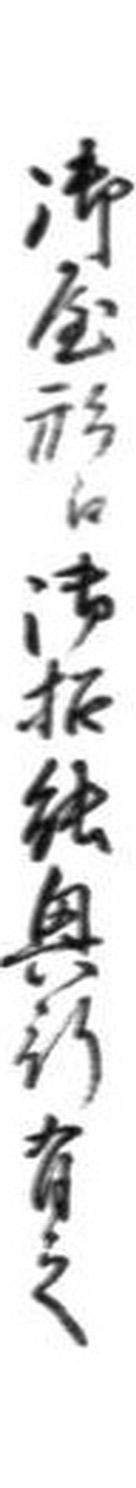御屋形江御招能興行有之
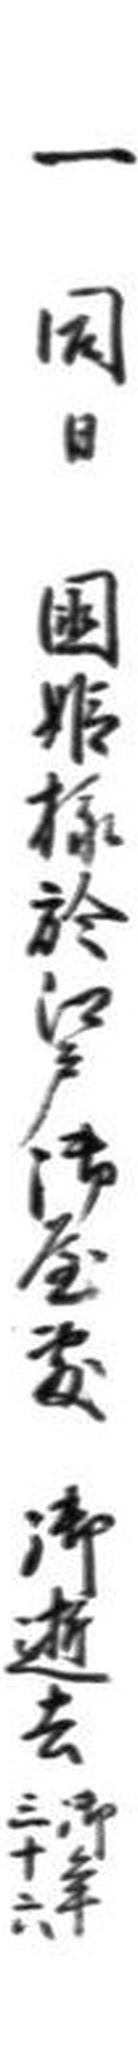一同日国姫様於江戸御屋敷御逝去御年三十六
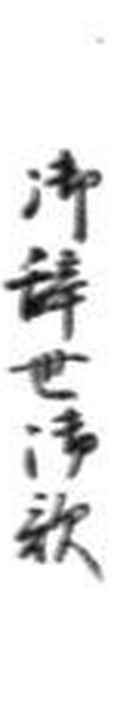御辞世御歌
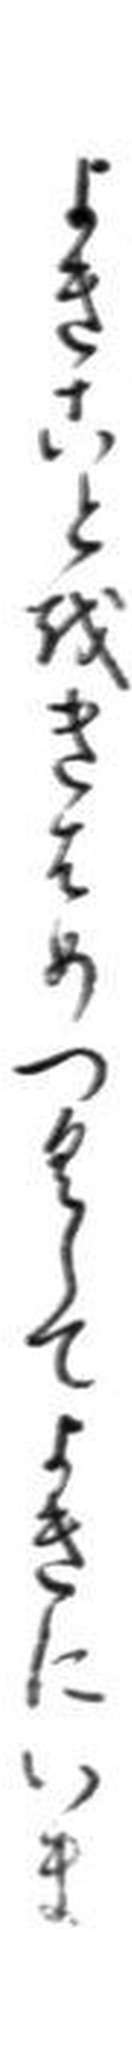よきことをきはめつくしてよきにいま
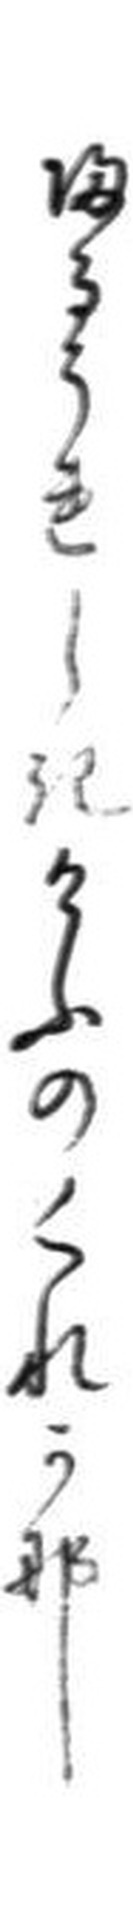帰るうれしきけふのくれかな

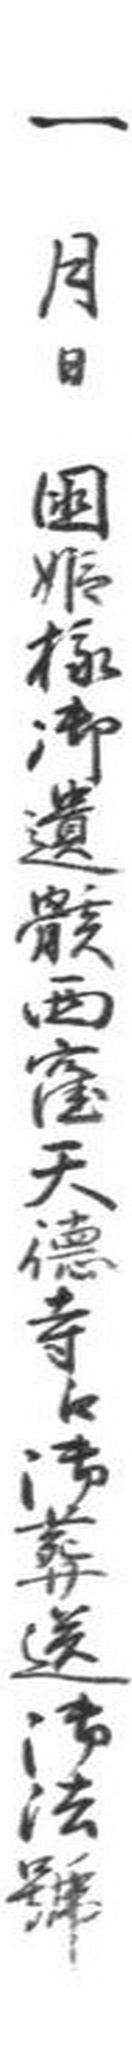一月日国姫様御遺骸西窪天徳寺江御葬送御法号
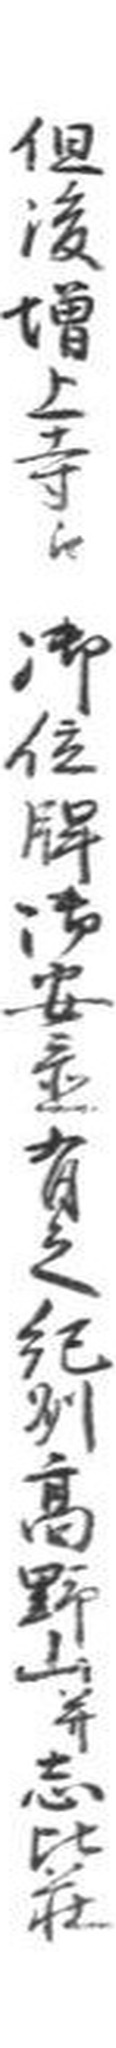但後増上寺江御位牌御安置有之紀州高野山并志比荘
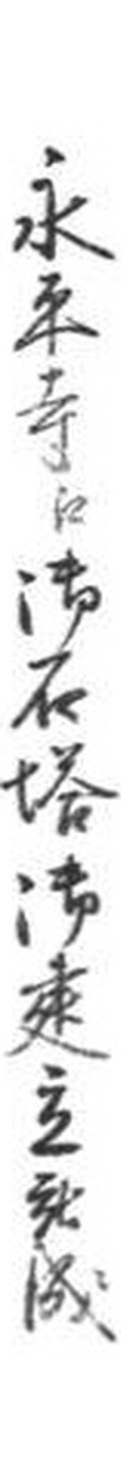永平寺江御石塔御建立被成
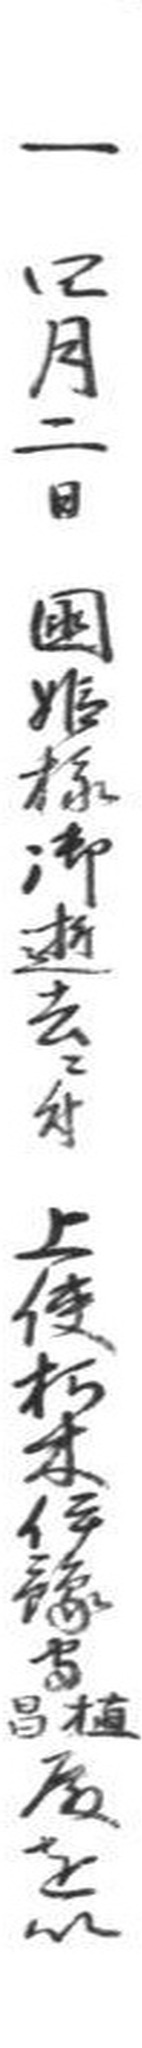一四月二日国姫様御逝去ニ付上使朽木伊予守植昌殿を以
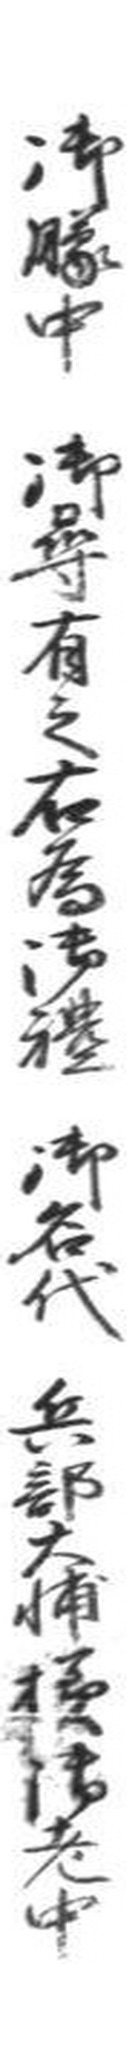御朦中御尋有之右為御礼御名代兵部大輔様御老中
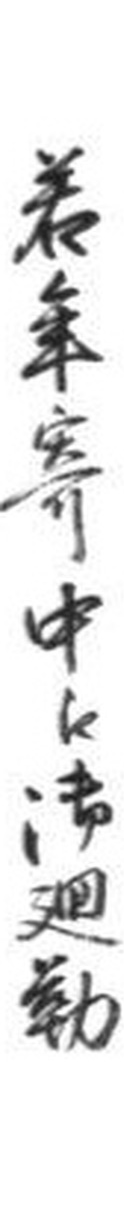若年寄中江御廻勤
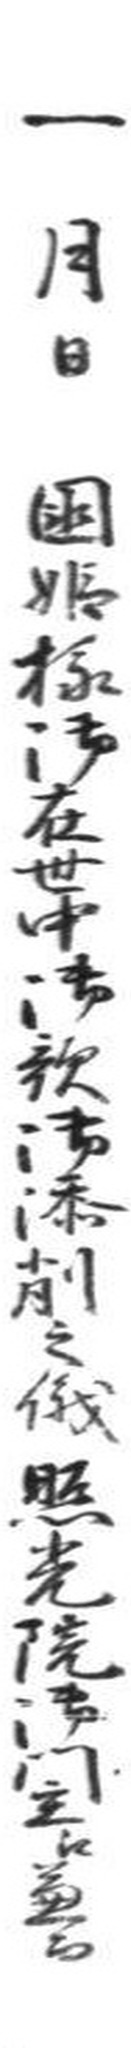一月日国姫様御在世中御歌御添削之儀照光院御門主江兼而
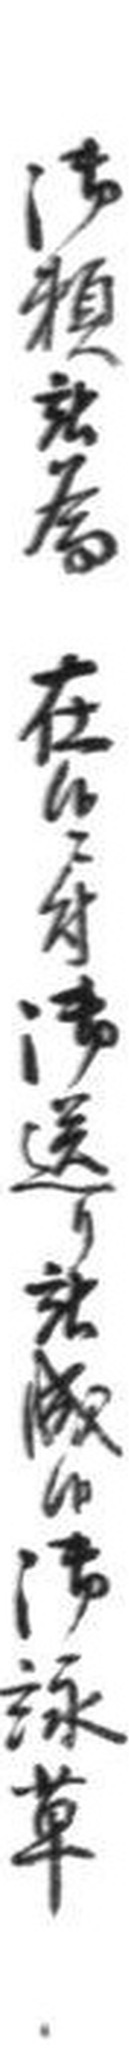御頼被為在候ニ付御送り被成候御詠草
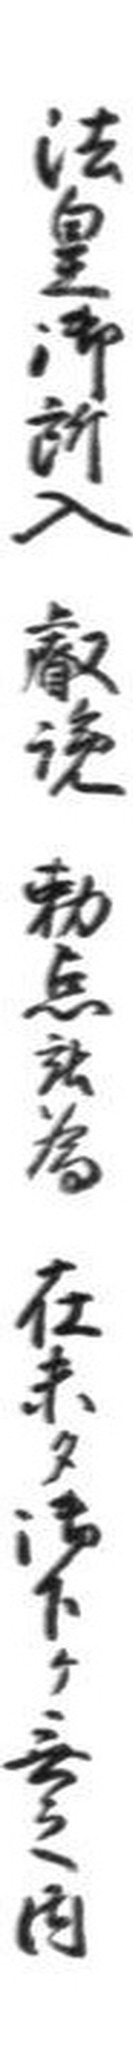法皇御所入叡覧勅点被為在未タ御下ケ無之内
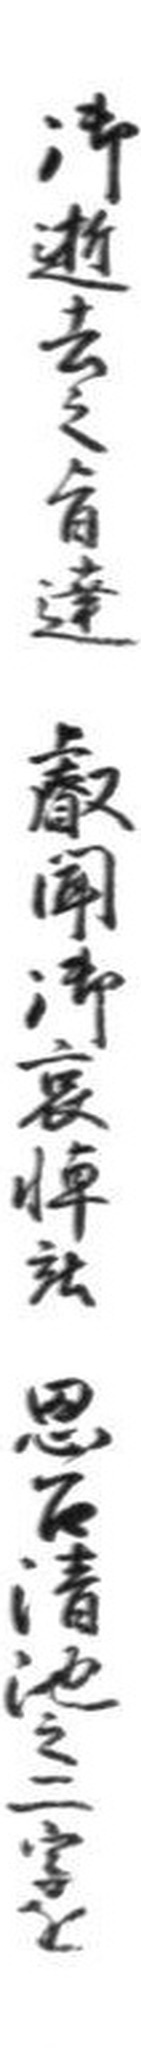御逝去之旨達叡聞御哀悼被思召清池之二字を
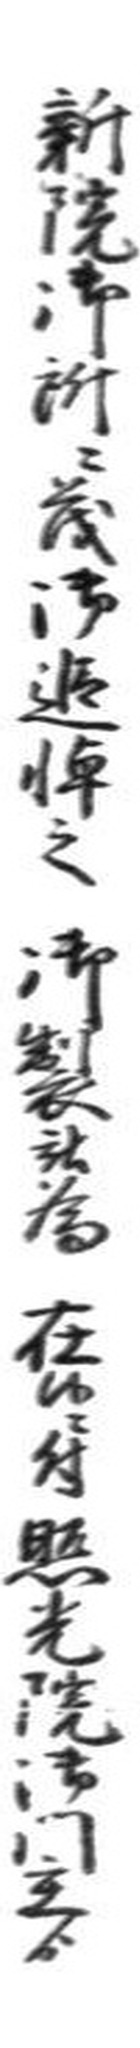新院御所ニも御追悼之御製被為在候ニ付照光院御門主ゟ
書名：家譜 八 光通公 従寛文十年到同十二年
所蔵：福井県文書館 Fukui Prefectural Archives
